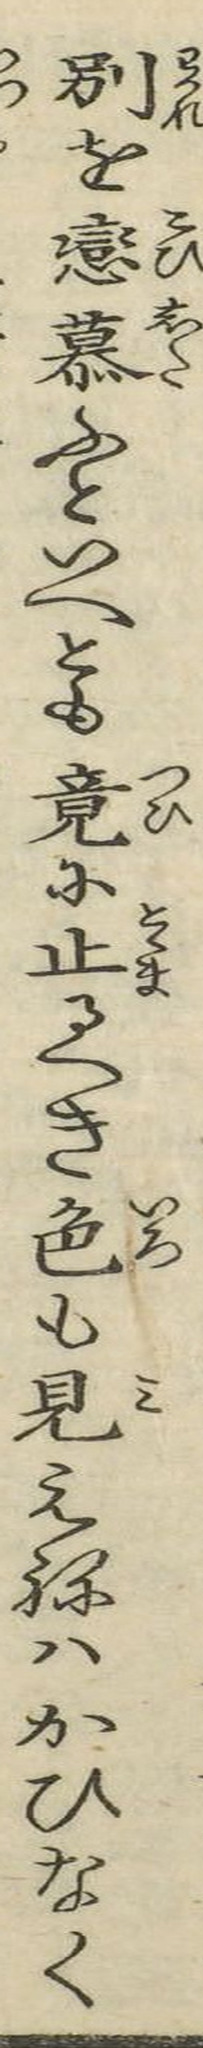別を戀慕ふといへとも竟に止るへき色も見えねはかひなく
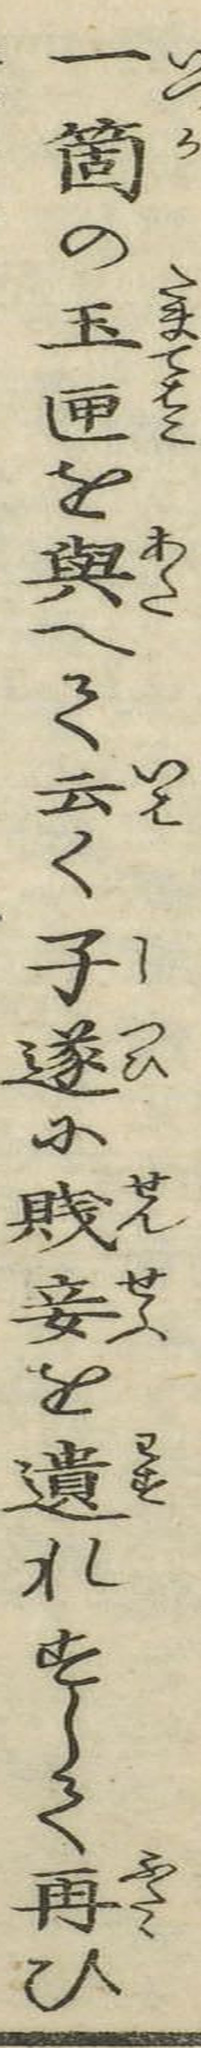一箇の玉匣を與へて云く子遂に賤妾を遺れすして再ひ
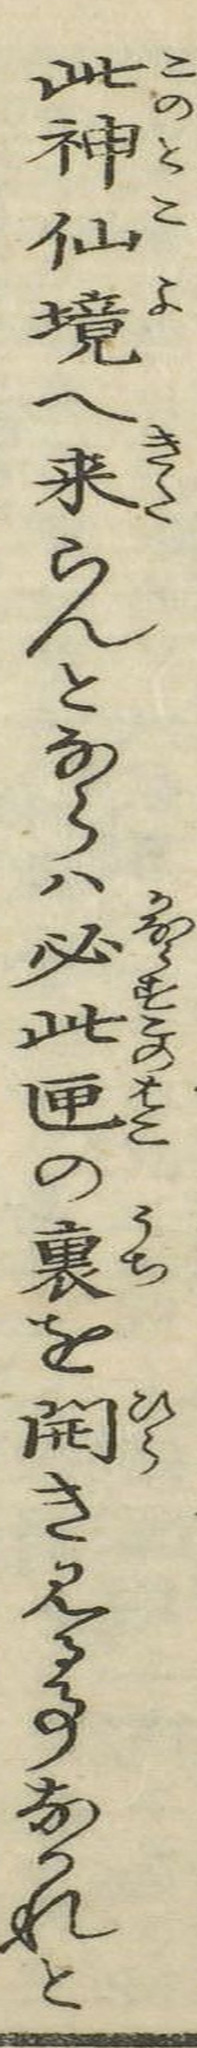此神仙境へ来らんとならは必此匣の裏を開き見る事なかれと
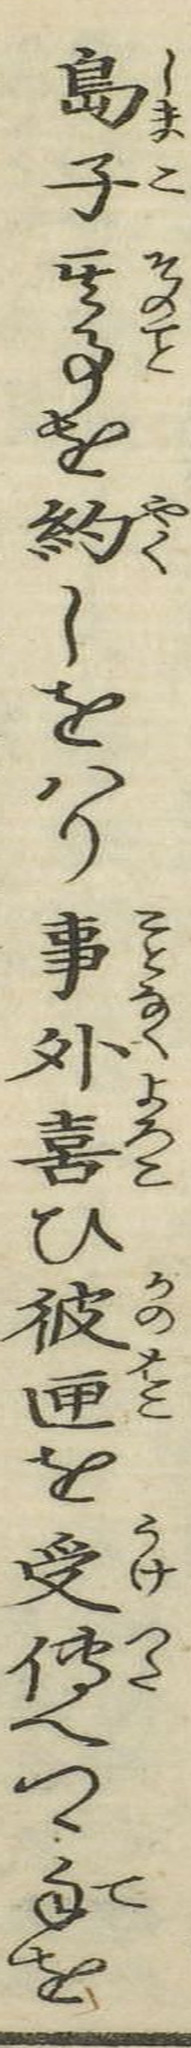島子其事を約しをはり事外喜ひ彼匣を受傳へつゝ手を
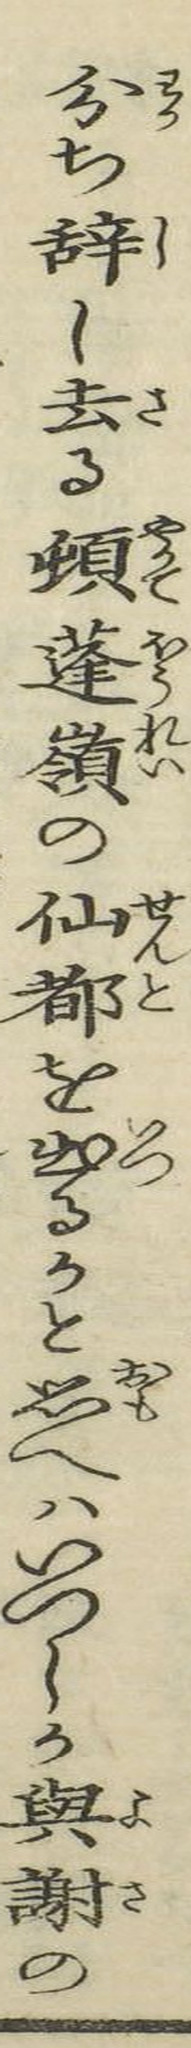分ち辞し去る頓蓬嶺の仙都を出るかと思へはいつしか與謝の
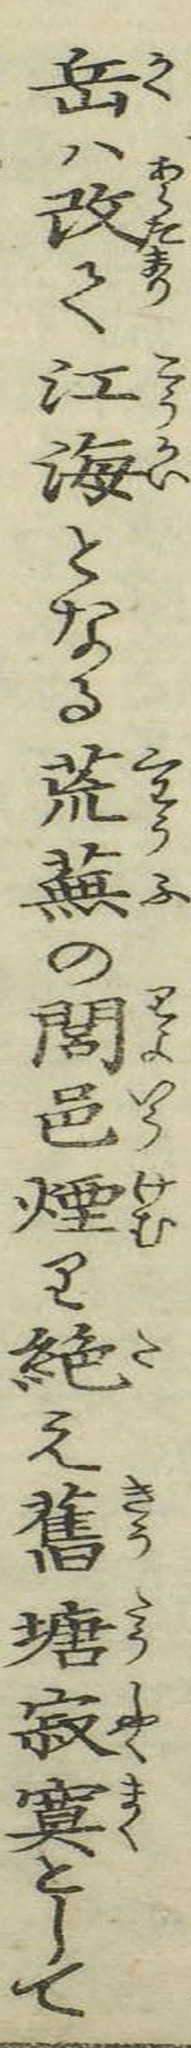岳は改て江海となる荒蕪の閭邑煙り絶え舊塘寂寞として
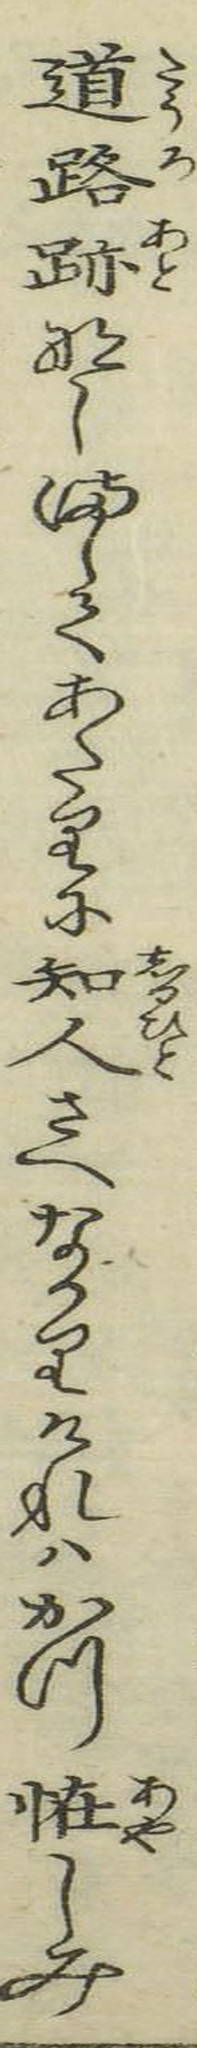道路跡なしましてあたりに知人さへなかりけれはかつ恠しみ
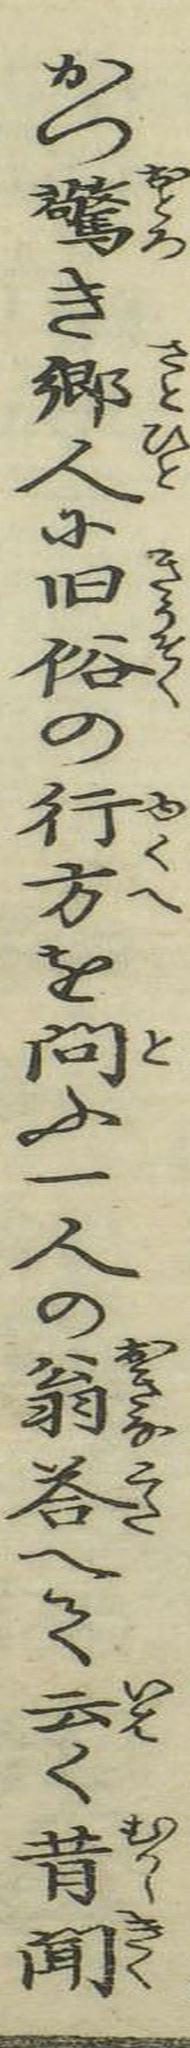かつ驚き郷人に旧俗の行方を問ふ一人の翁答へて云く昔聞

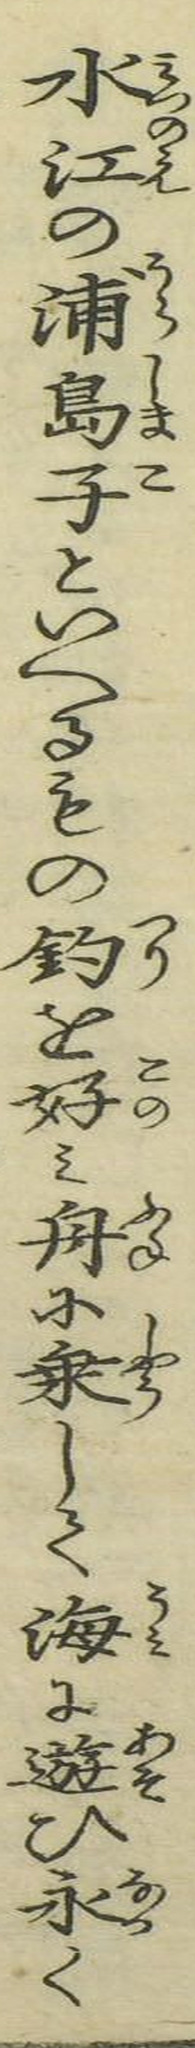水江の浦島子といへるもの釣を好み舟に乗して海に遊ひ永く
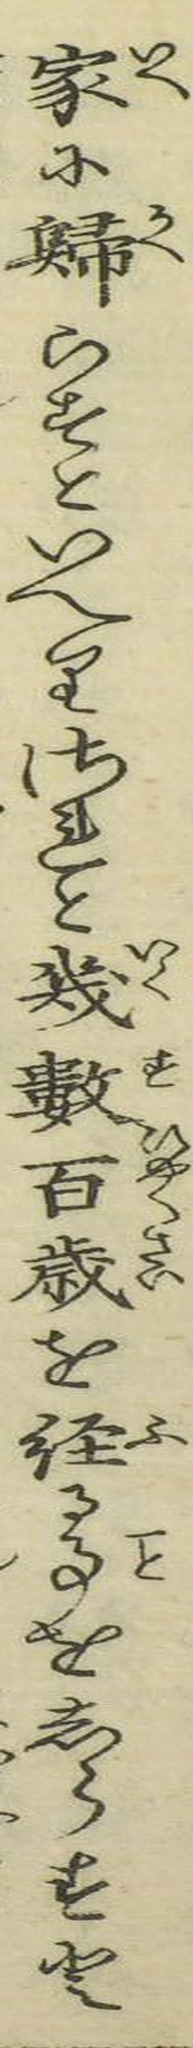家に歸らすといへりされと幾數百歳を経る事をしらすと
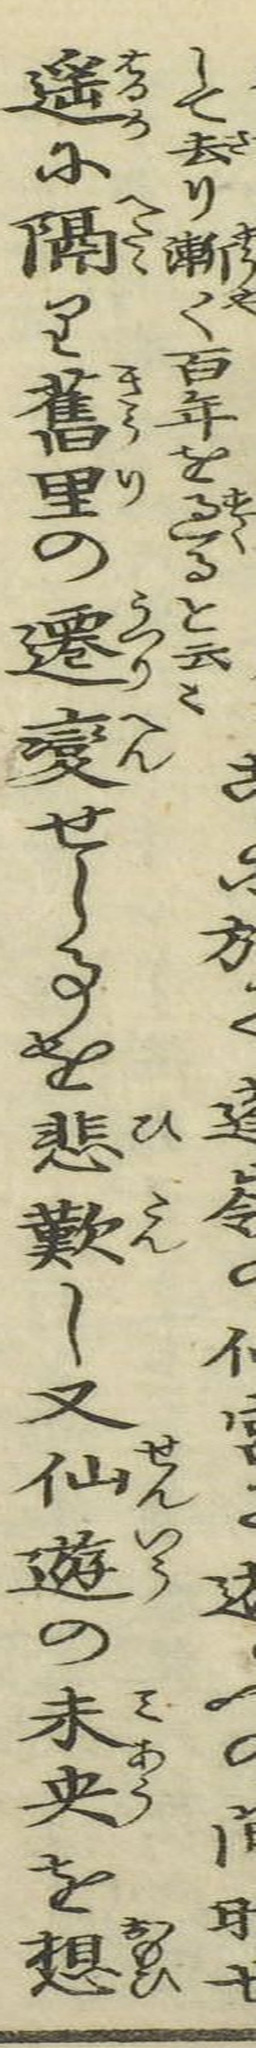遥に隔り舊里の遷變せし事を悲歎し又仙遊の未央を想
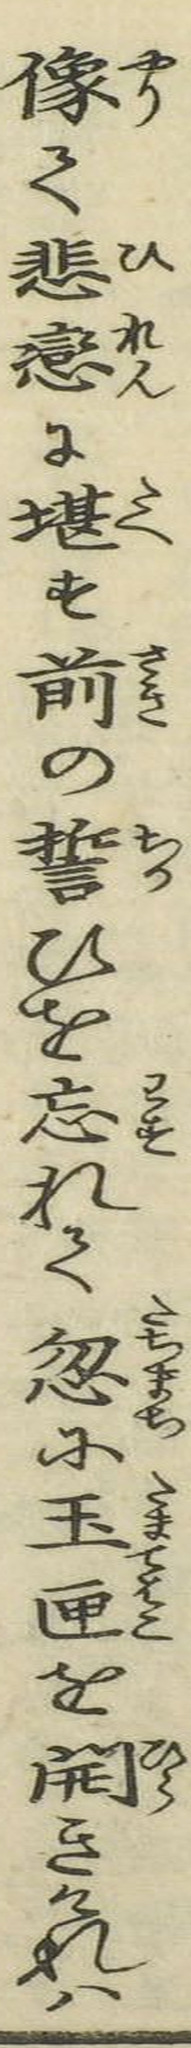像て悲戀に堪す前の誓ひを忘れて忽に玉匣を開きけれは
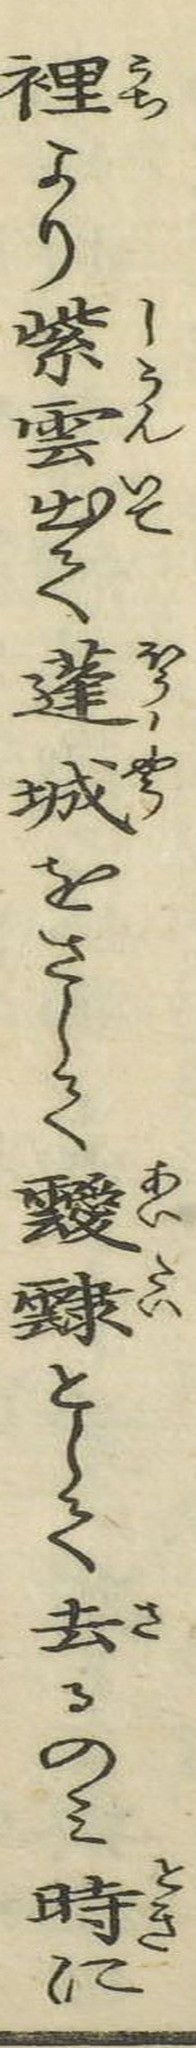裡より紫雲出て蓬城をさして靉靆として去るのみ時に
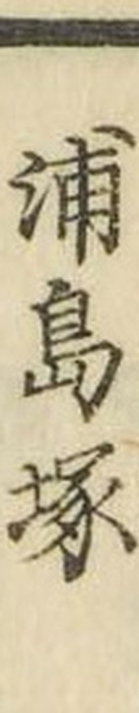浦島塚

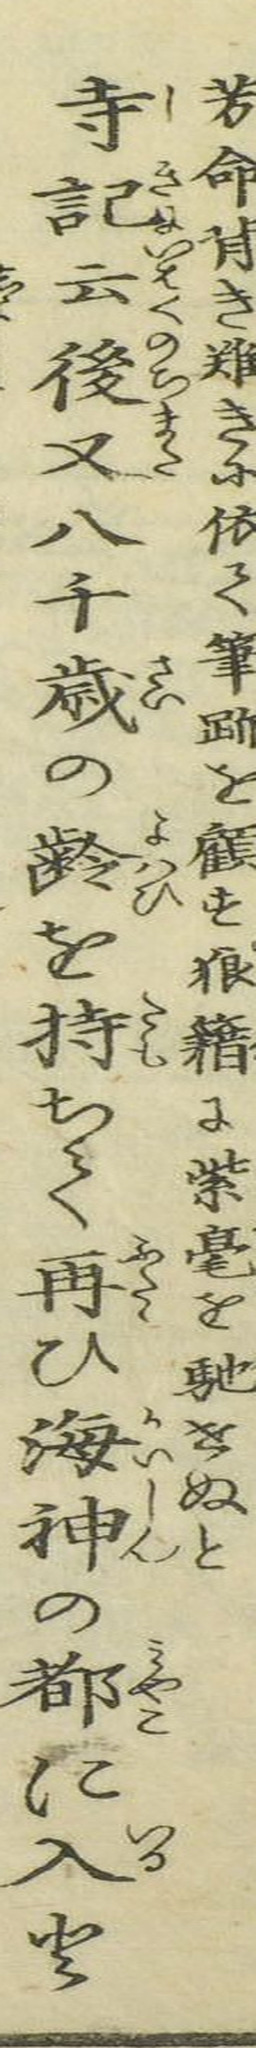寺記云後又八千歳の齢を持ちて再ひ海神の都に入と
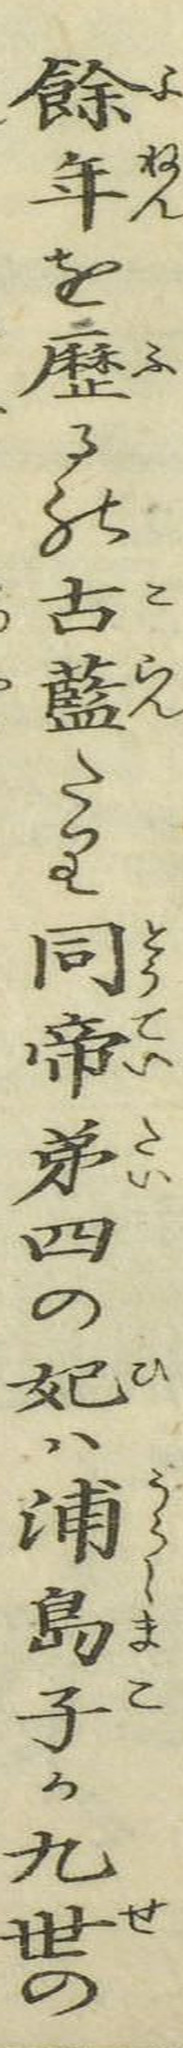餘年を歴るの古藍たり同帝第四の妃は浦島子か九世の
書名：江戸名所図会 20巻 巻之5
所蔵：東京学芸大学教育コンテンツアーカイブ
